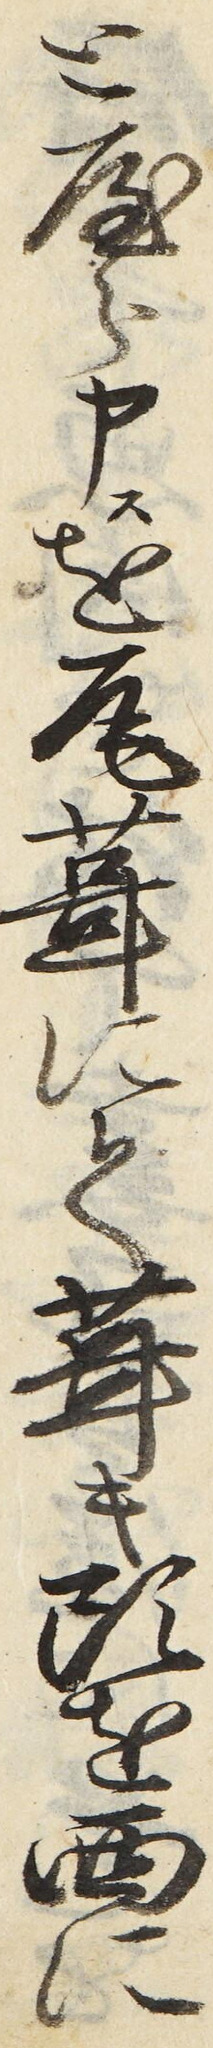とやら申すを瓦葺にて葺き頭を西に
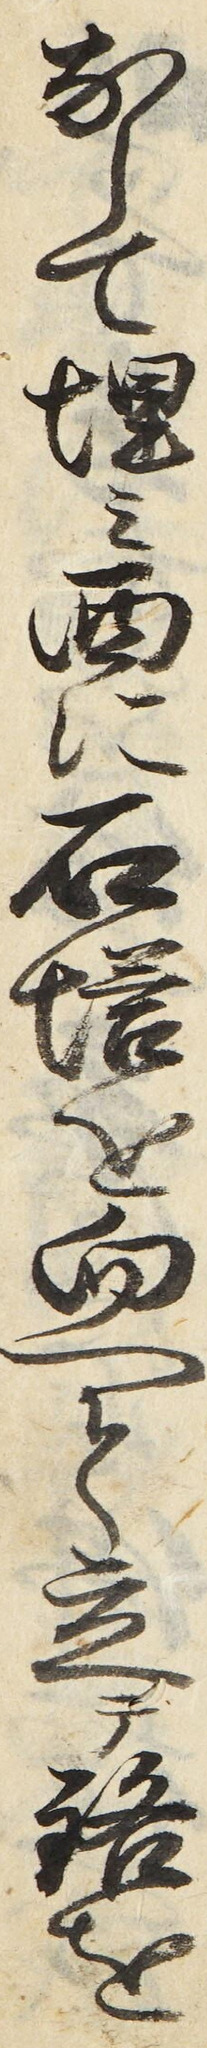なして埋み西に石塔を向へて立て銘を

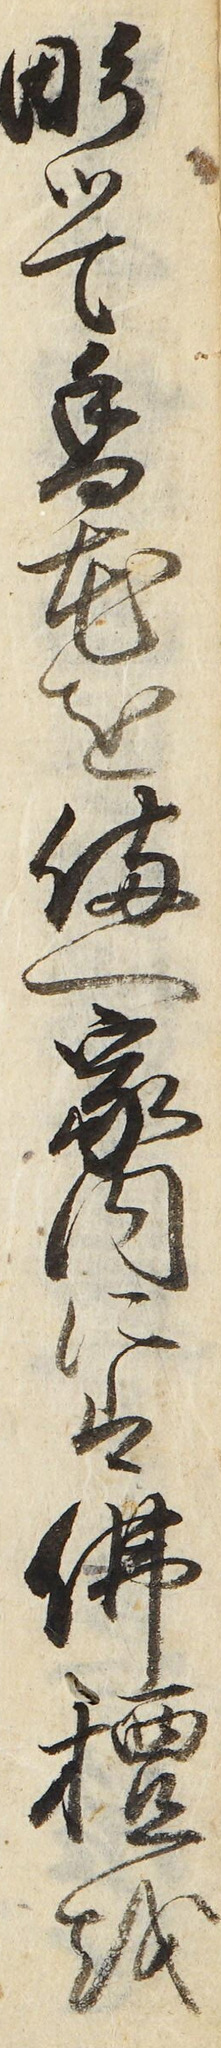彫って香花を備へ家内には仏檀を
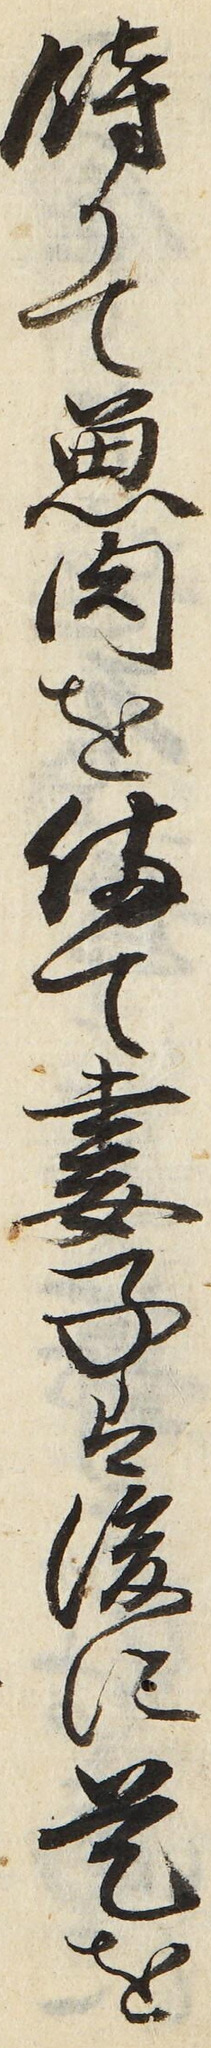餝りて魚肉を備て妻子は後に是を
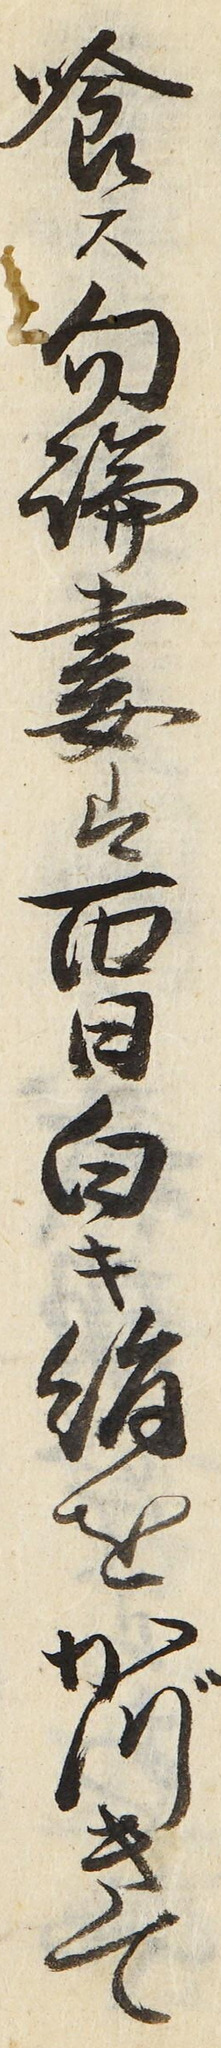喰す勿論妻は百日白き絹をかづきて
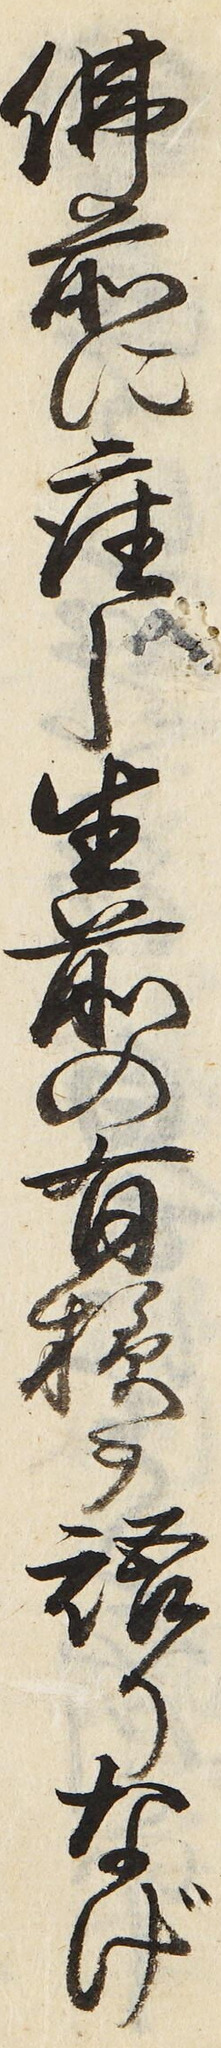仏前に座し生前の有様を語りなげ
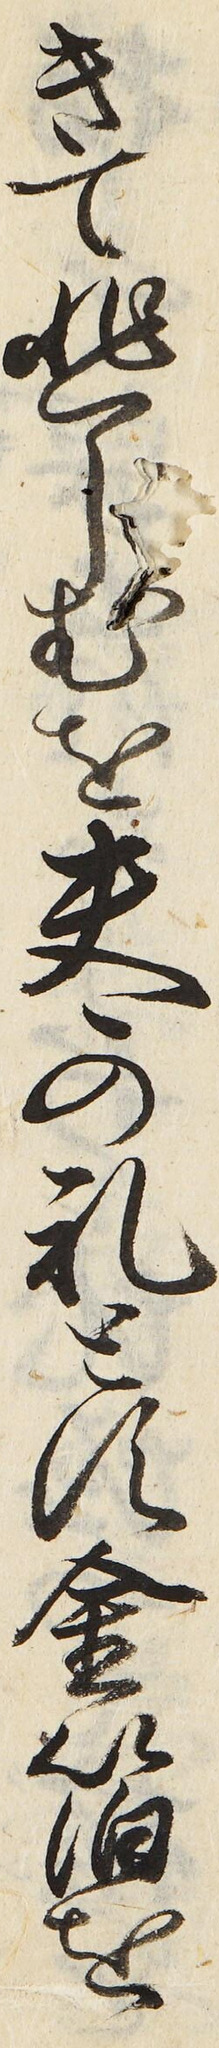きて悲しむを夫々の礼とす金箔を
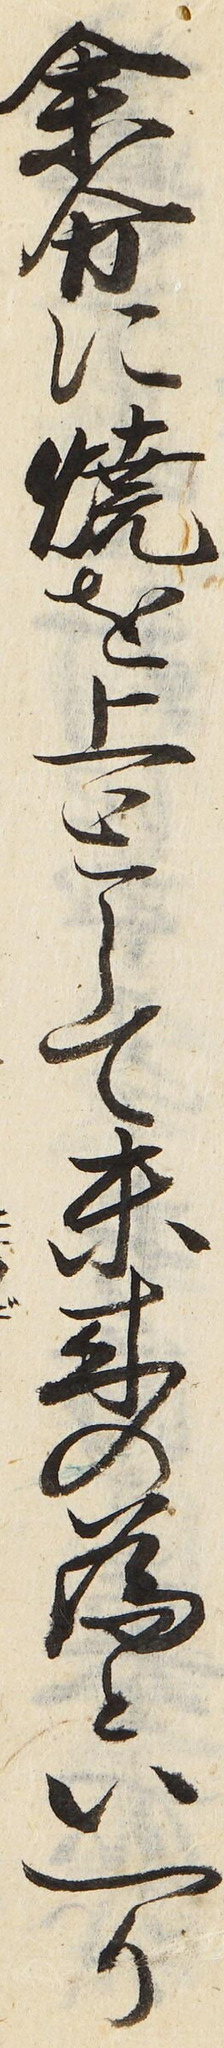余分に焼を上として未来の為といへり
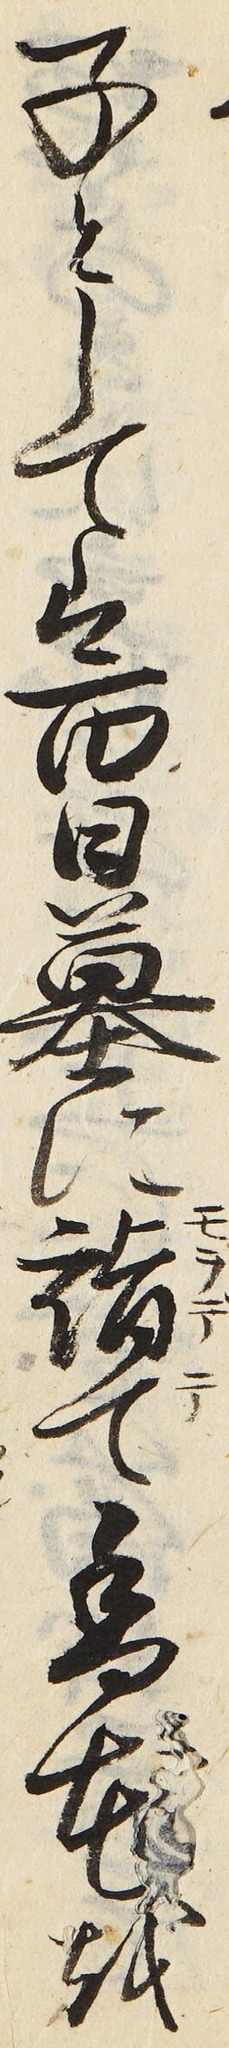子としては百日墓に詣て香花を
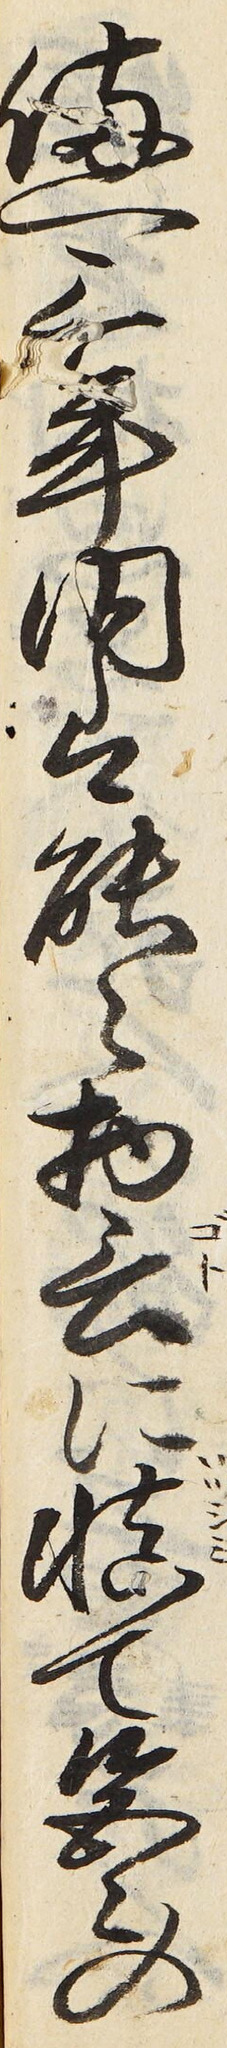備へ三年内は能々物云に慎て色々の
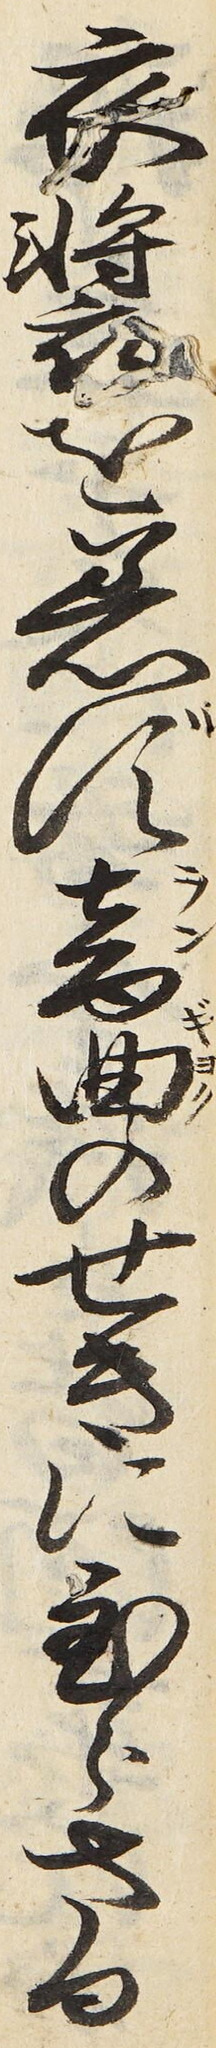衣装を着ず音曲のせきに至らさる
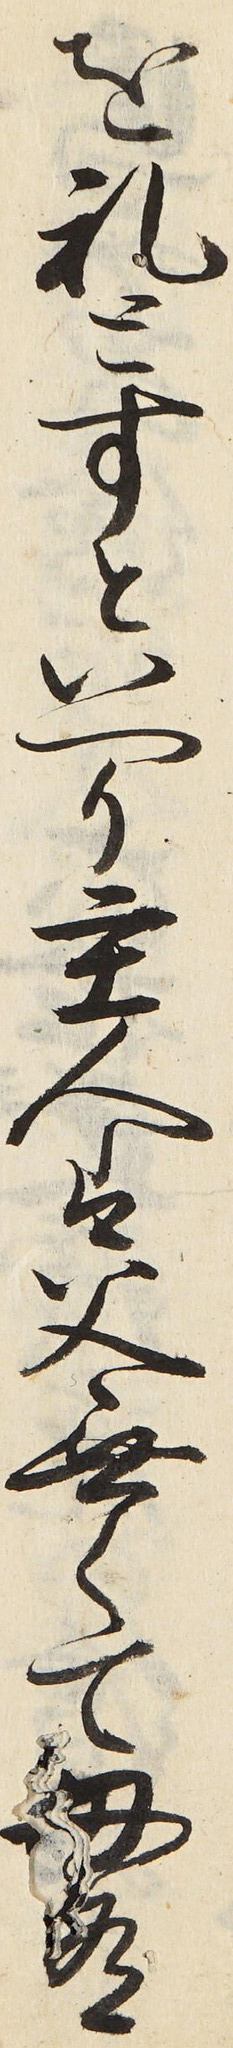を礼とすといへり主人は父無くて母有
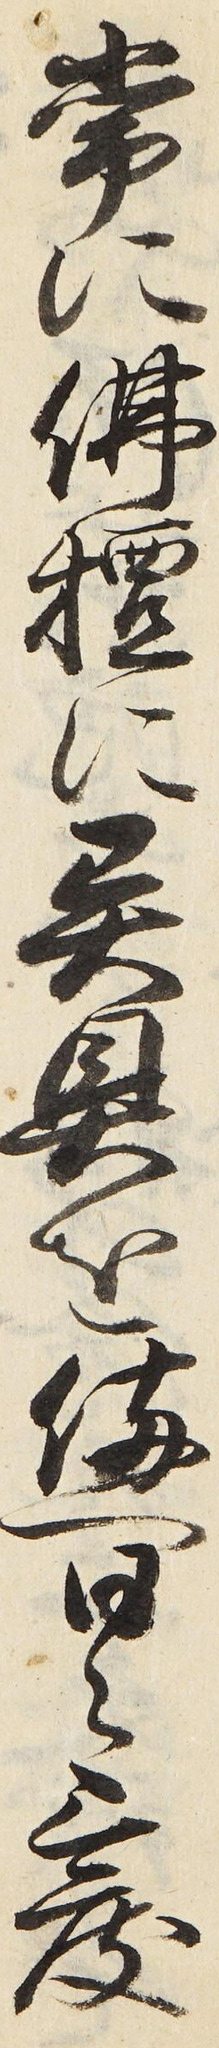常に仏檀に異具を備へ日々三度
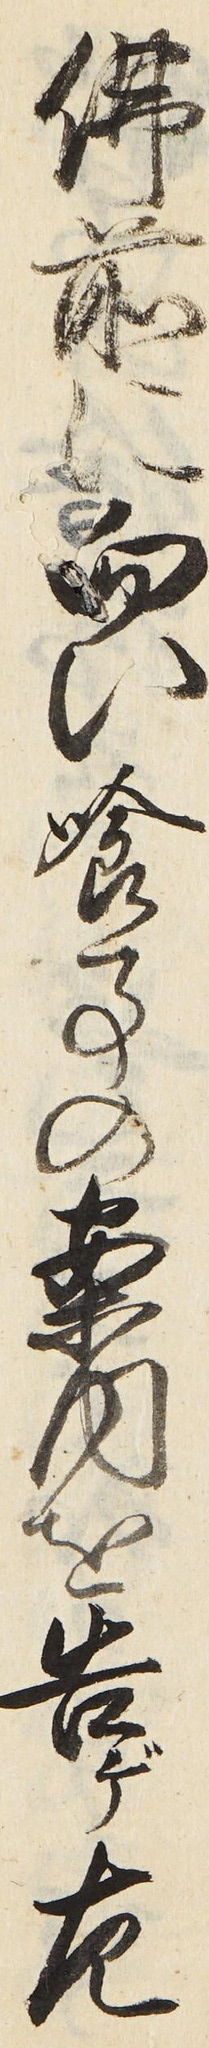仏前に向い喰事の案内を告げさ
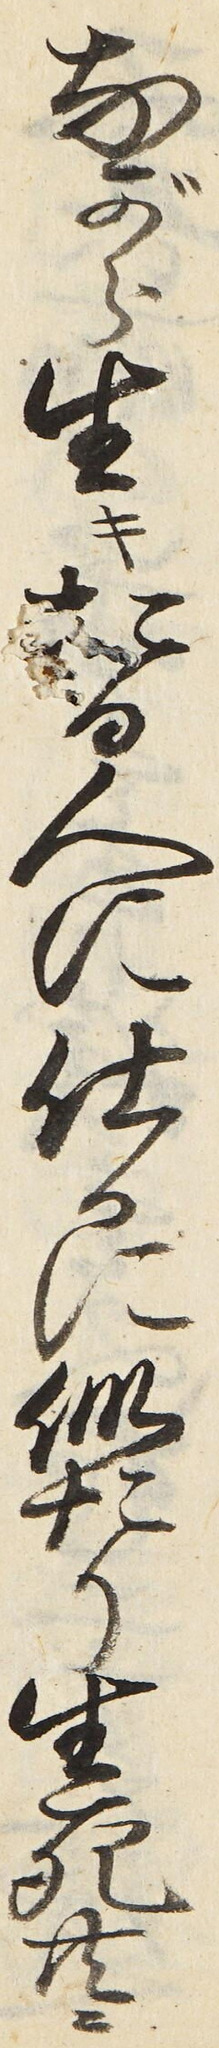ながら生きたる人に仕るに似たり生死共に
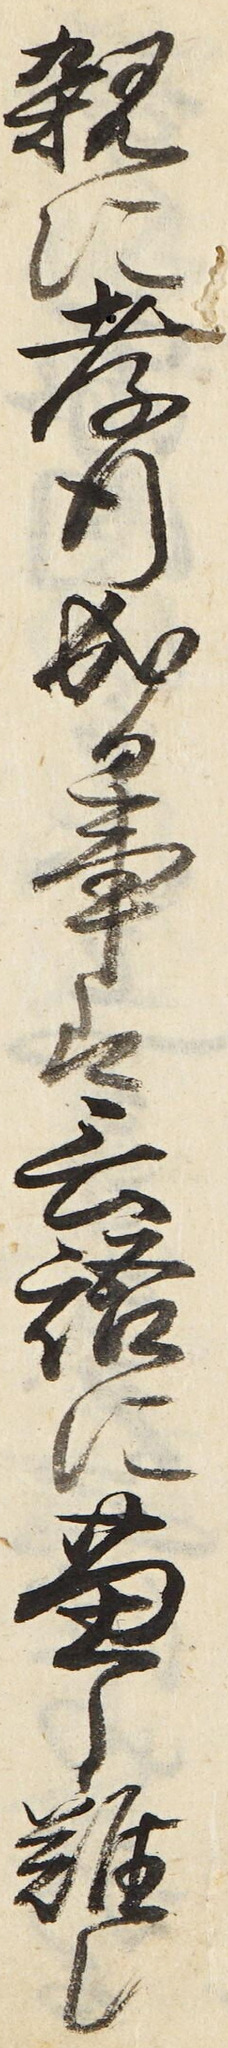親に孝行成る事は言語に尽し難し
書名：華夷九年録
